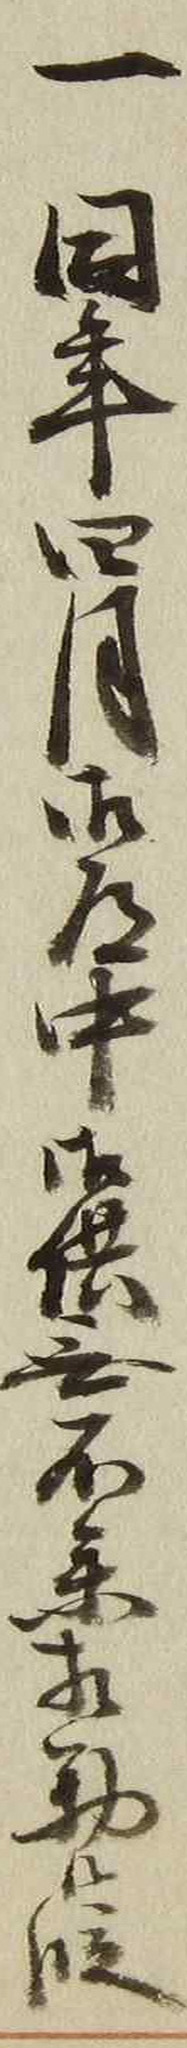一同年四月御道中御供無不参相勤候段
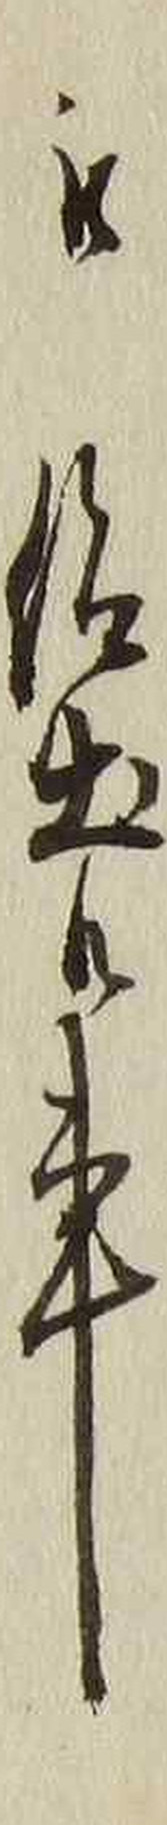被仰出候事
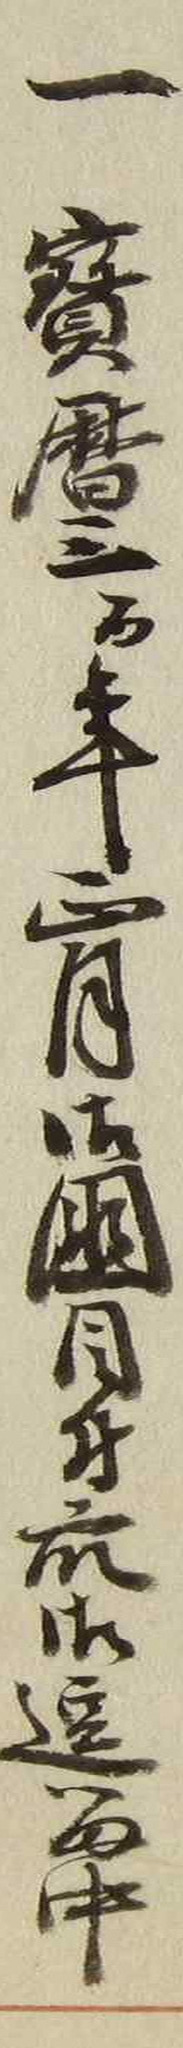一宝暦三酉年正月御国目付衆御逗留中
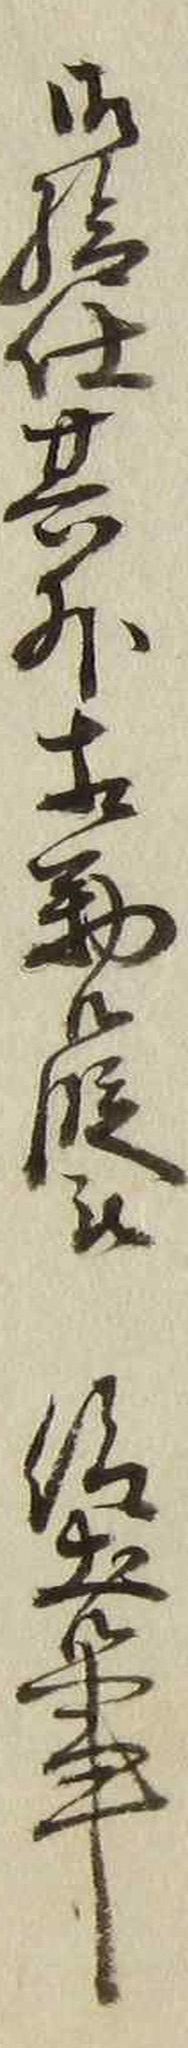御給仕其外相勤候段被仰出候事
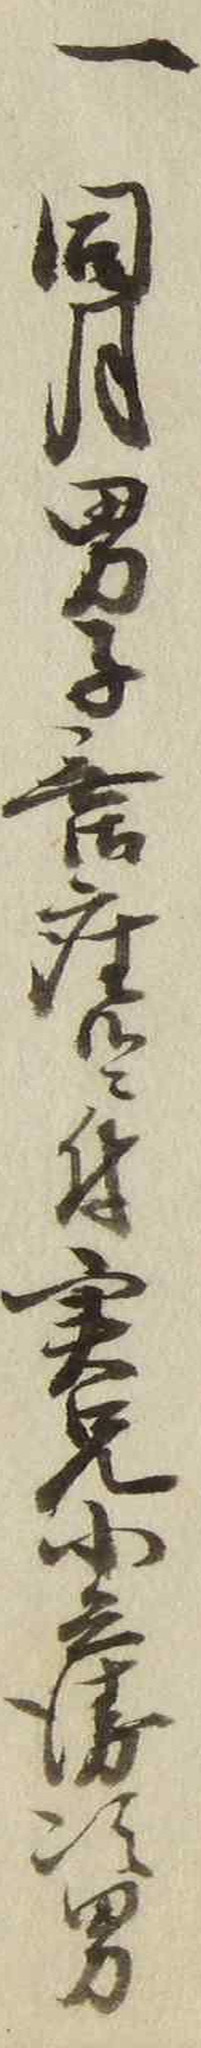一同月男子無御座候ニ付実兄小兵衛次男
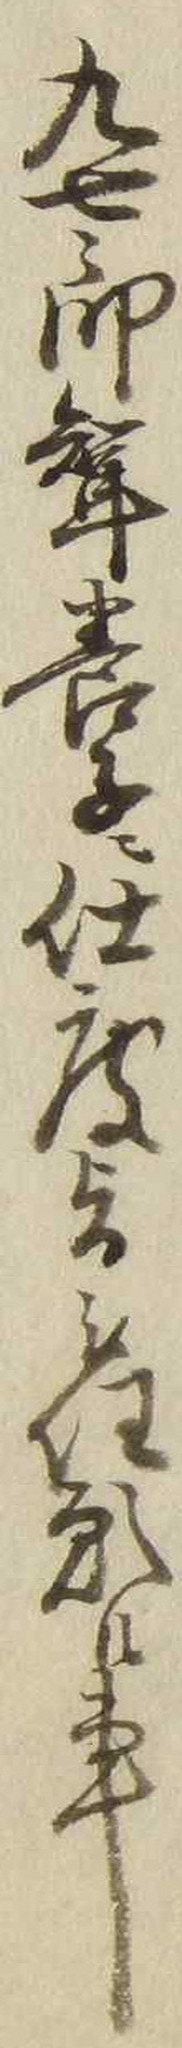九七郎婿養子ニ仕度旨被任願候事

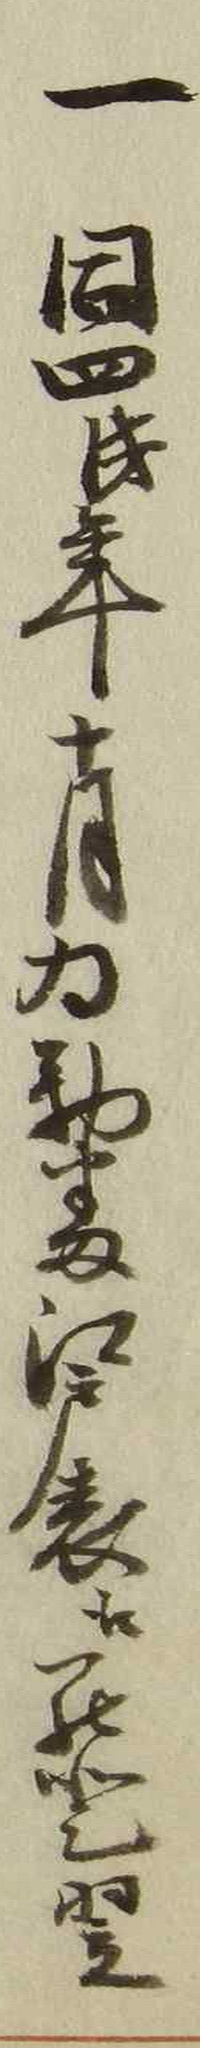一同四戌年十月為勤番江戸表江罷登翌
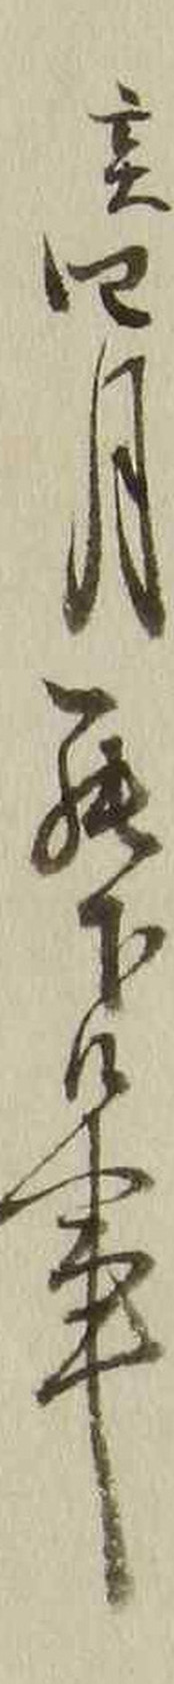亥四月罷下候事
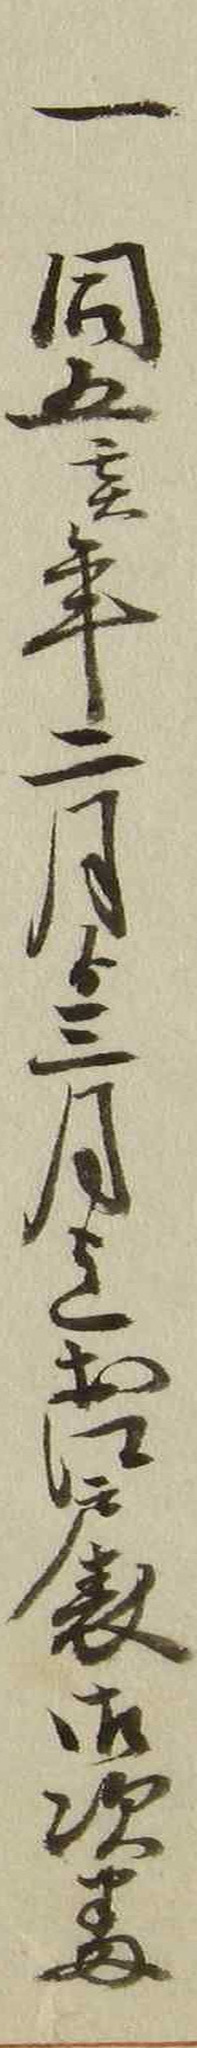一同五亥年二月ゟ三月迄於江戸表御次番
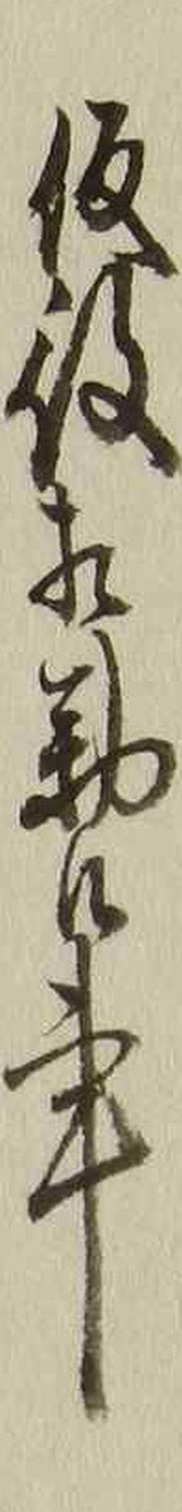仮役相勤候事
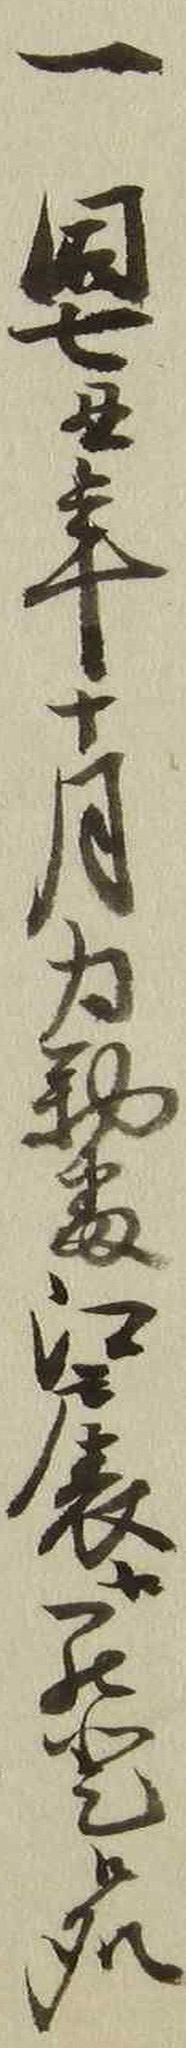一同七丑年十月為勤番江戸表江罷登候処
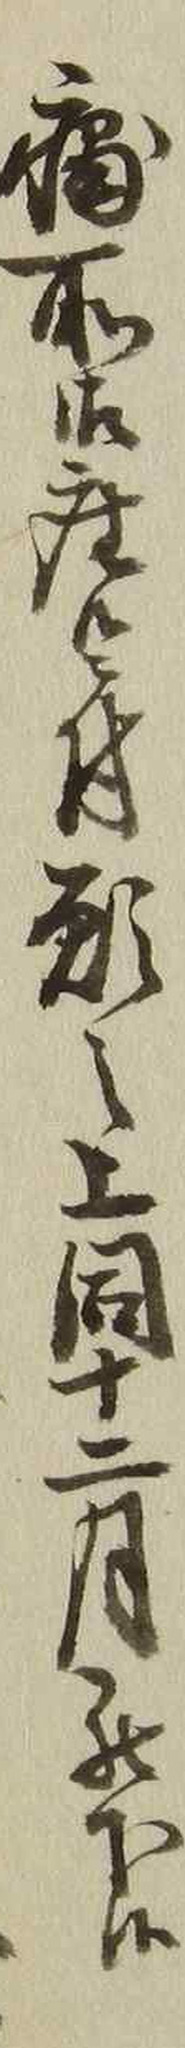痛所御座候ニ付願之上同十二月罷下候
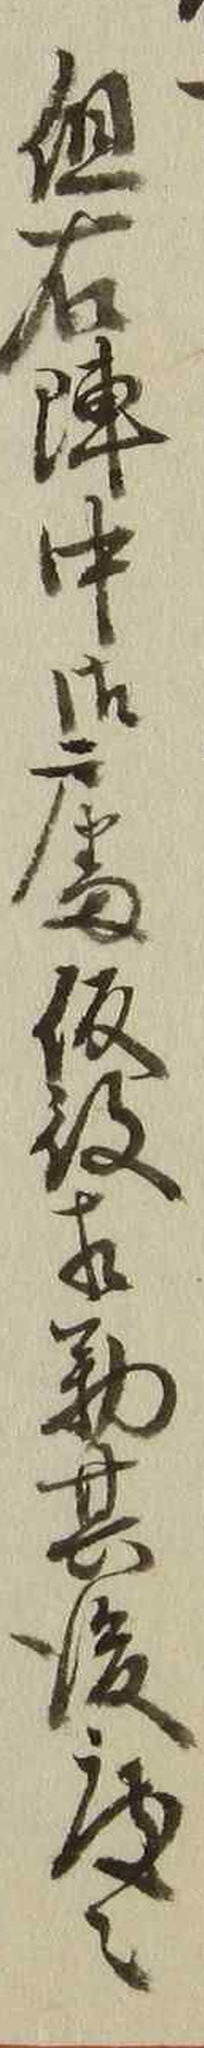但右陣中御戸番仮役相勤其後度々
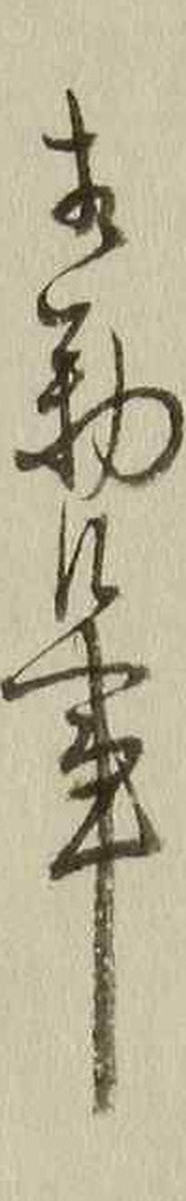相勤候事
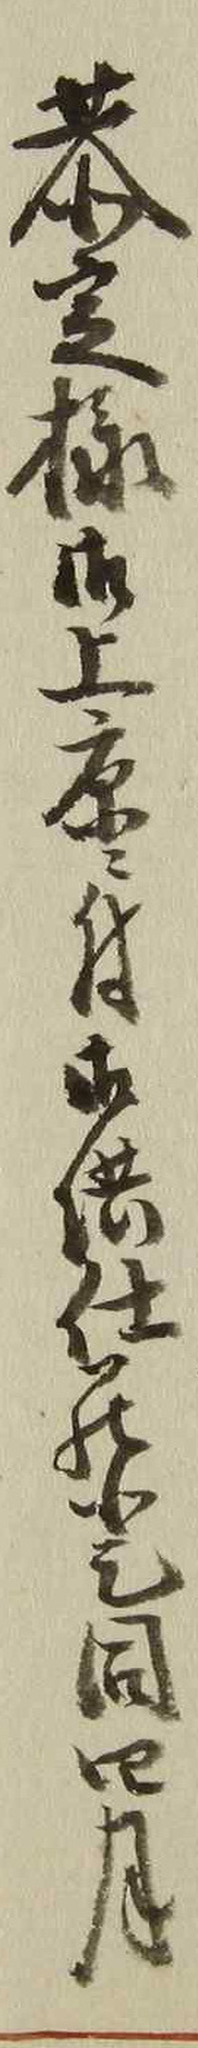恭定様御上京ニ付御供仕罷登同四月
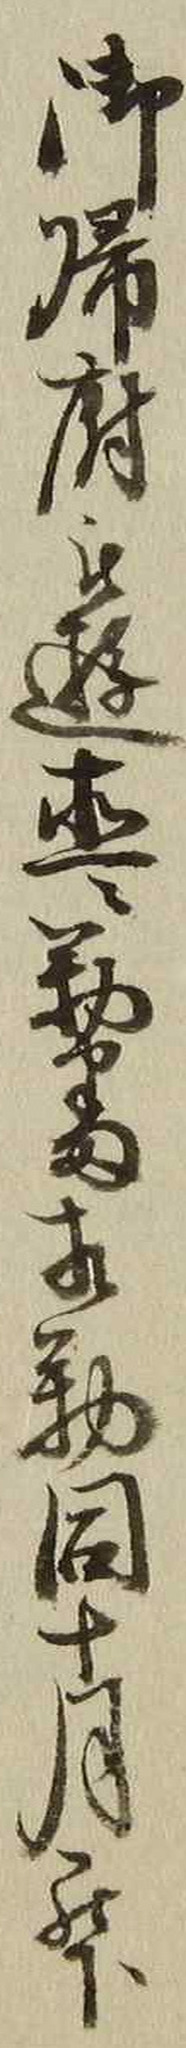御帰府被遊直ニ勤番相勤同十月罷下
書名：諸士系譜　巻之53　に之部4
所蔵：会津若松市立会津図書館
